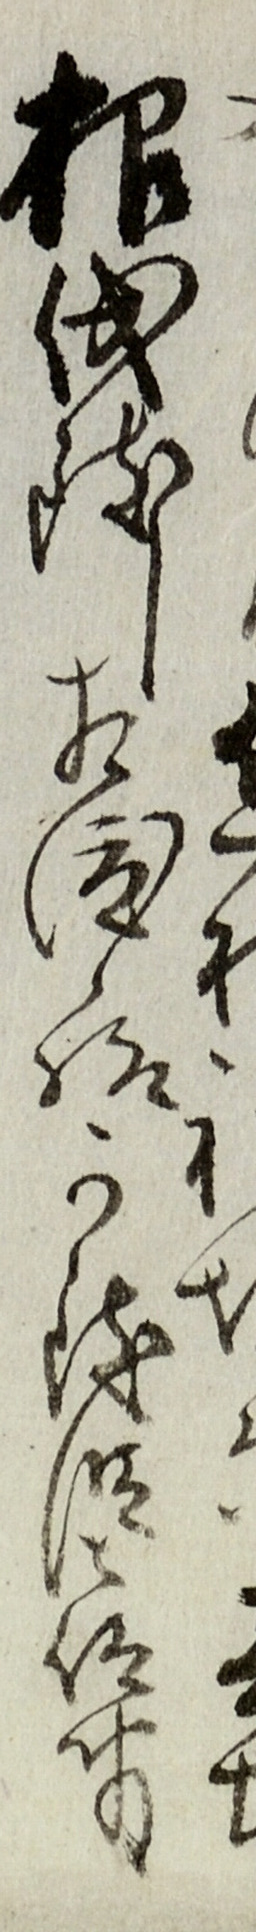根伐致し相渡候様可致段被仰聞候
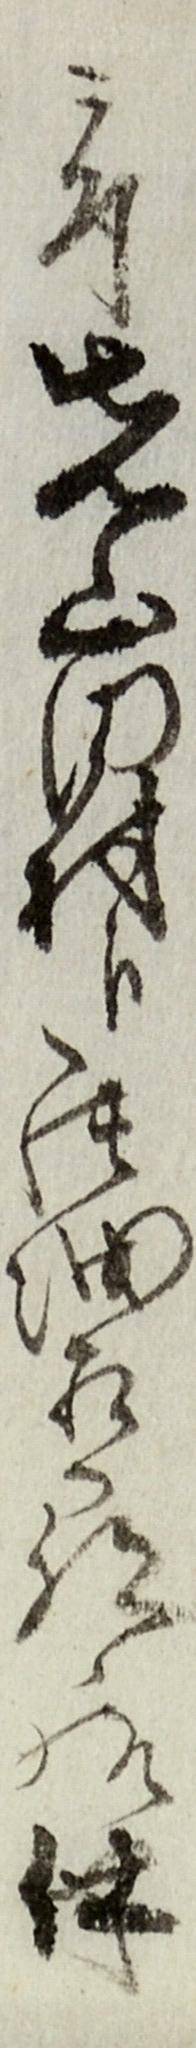ニ付先山田村江罷越相尋候様仕
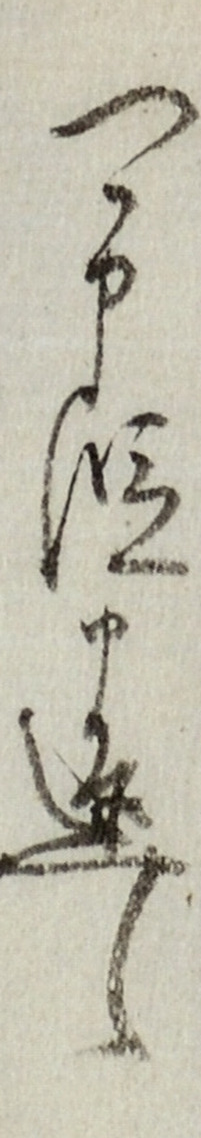可申談申達候
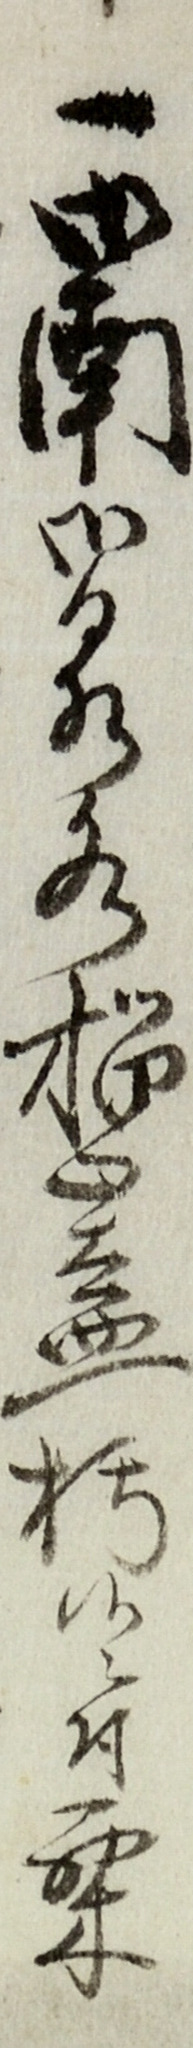一御南御泉水榴蓋朽候ニ付栗
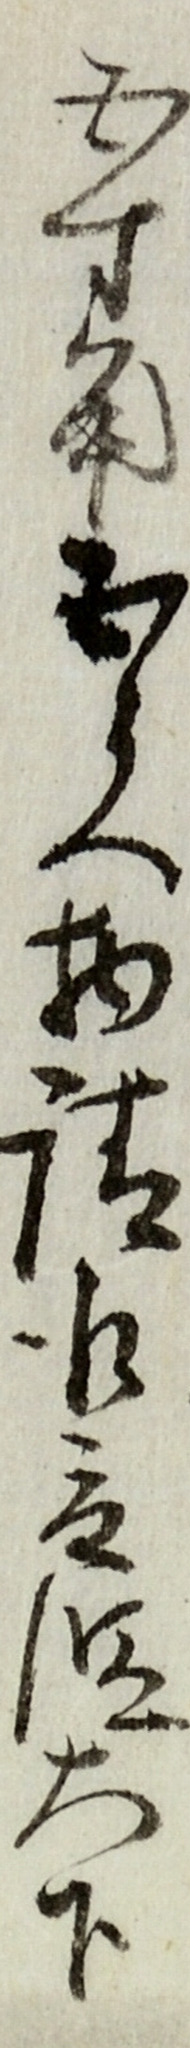五寸角五尺物請取度段大下
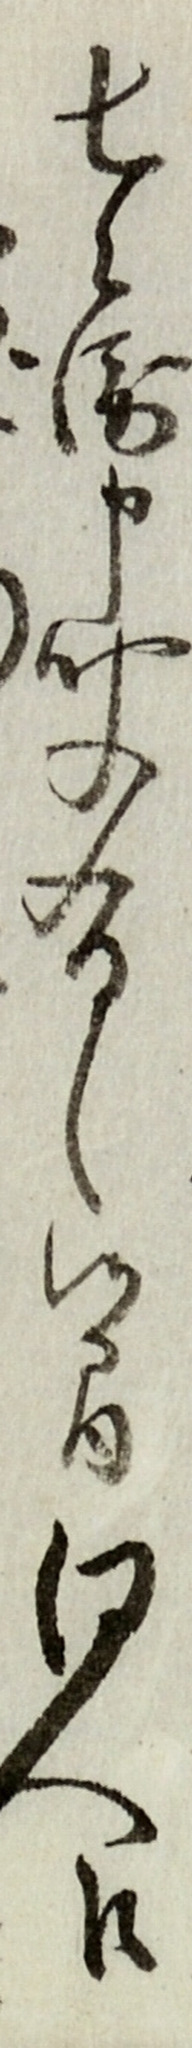七兵衛申聞有之候間同人江
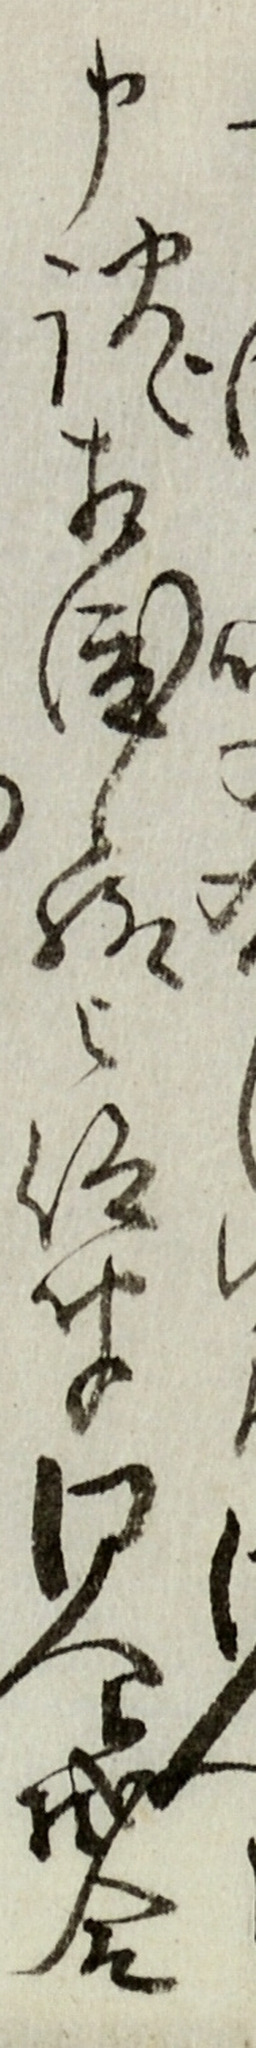申談相渡候様被仰聞同人江掛合
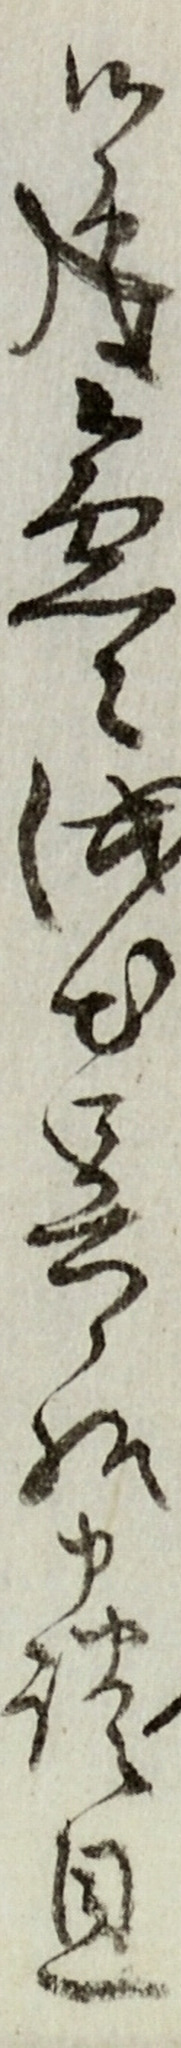候処兼々伐出呉候様申談且
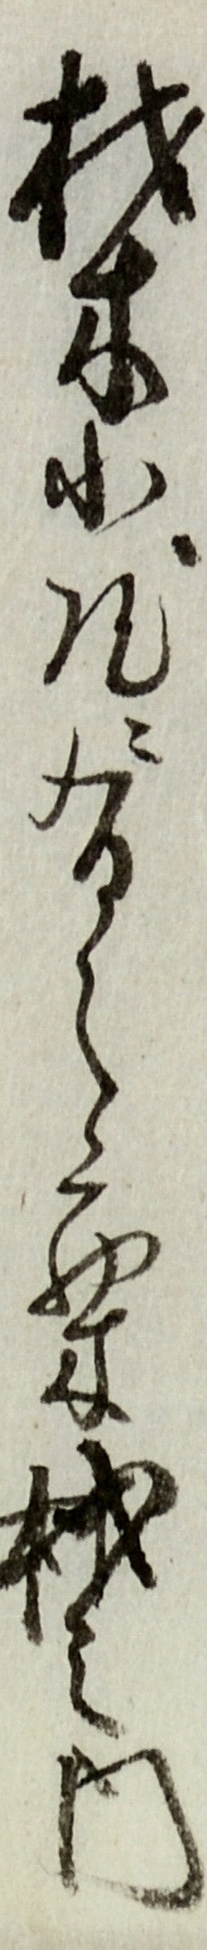材木小屋ニ有之候栗材之内
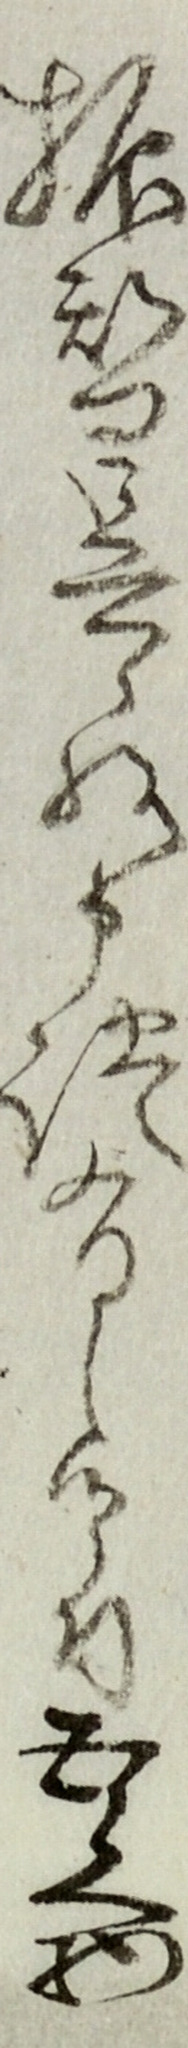振替呉候様申談有之候ニ付五尺物
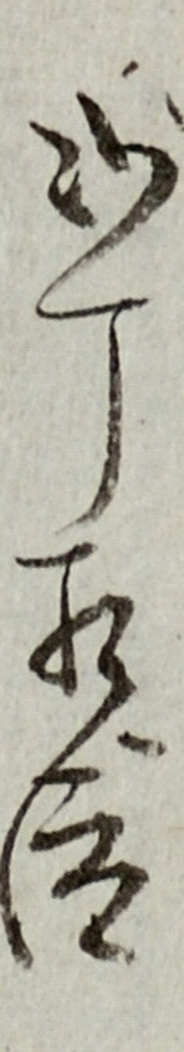弐丁相渡
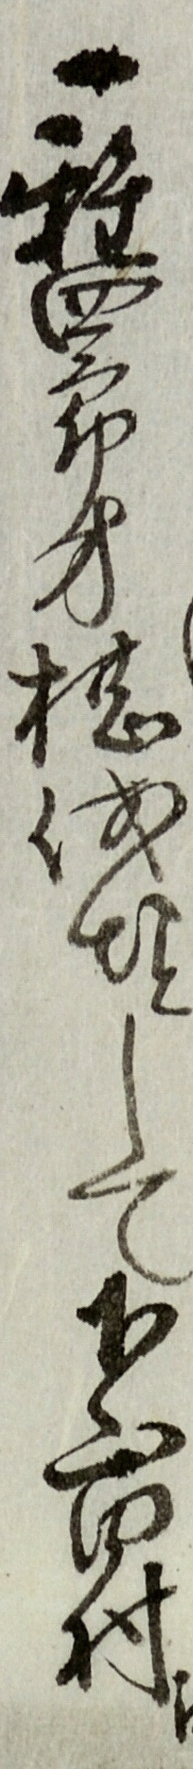一雅四郎方椹伐出として下山田村江

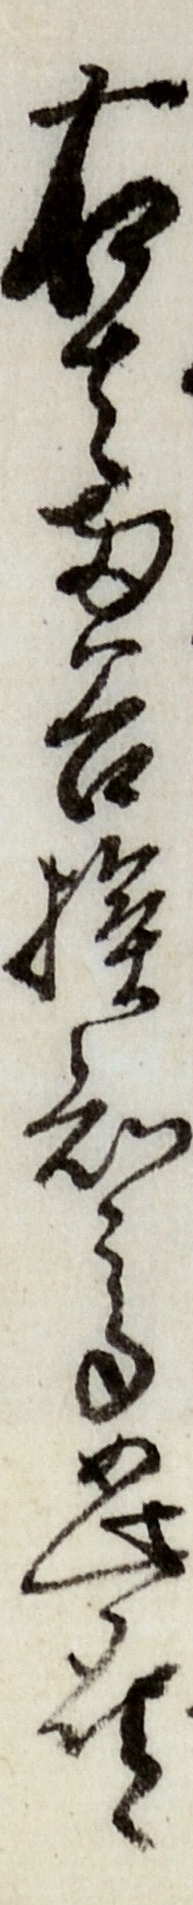右者両谷検知高如此御座候
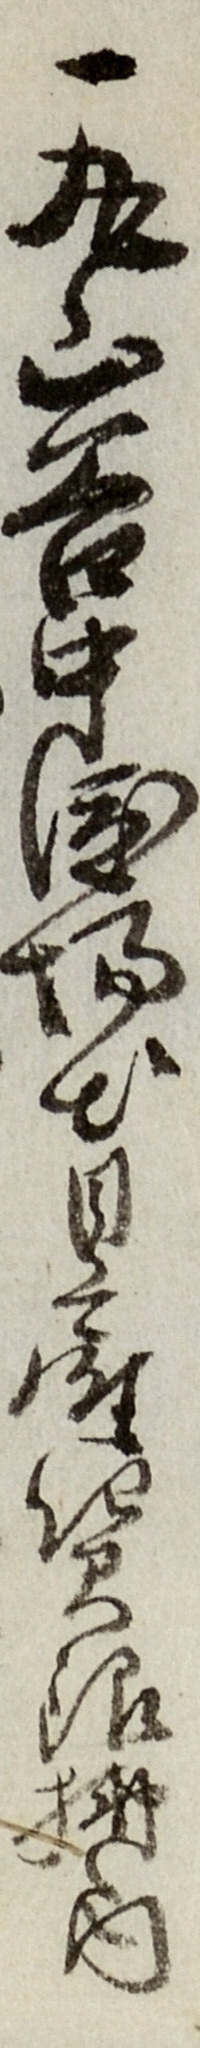一丸山谷中渡場出日雇賃銀払之内
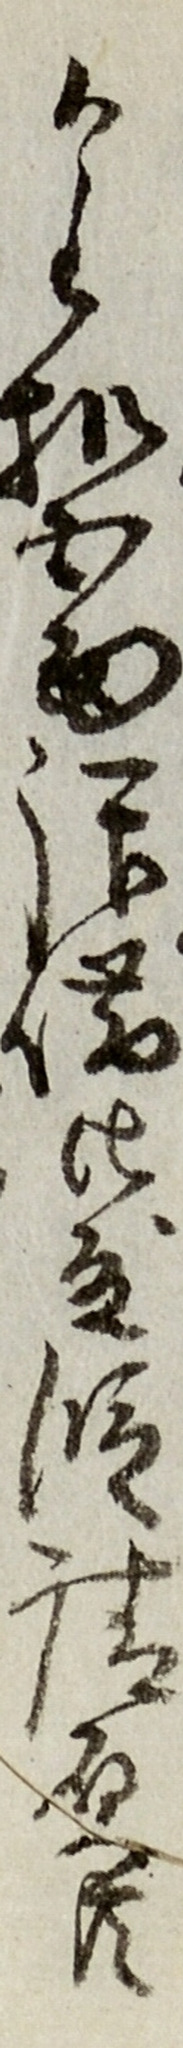金拾五両拝借仕度段請負共
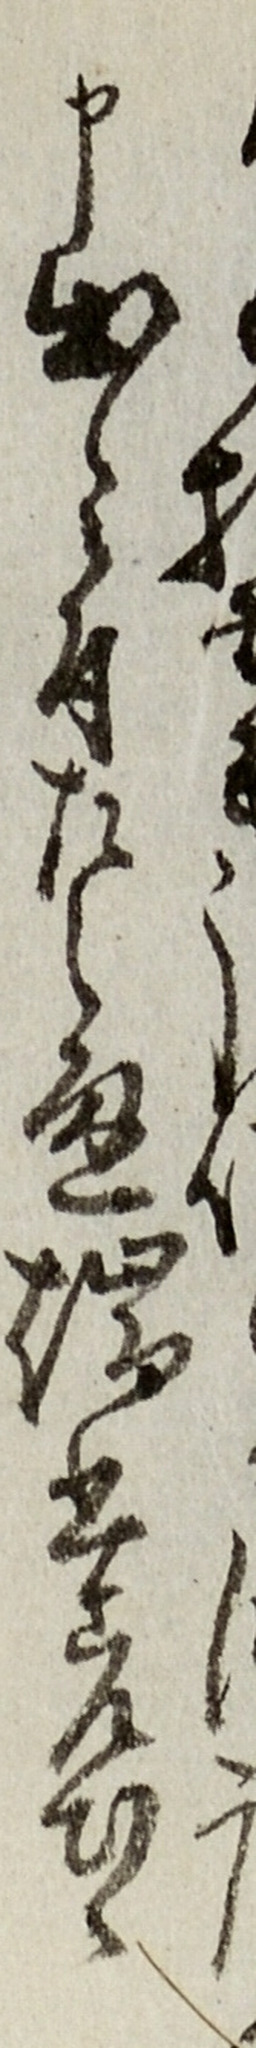申出候ニ付左之通端書差出候
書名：御山方御薪方諸事御用留
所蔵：伊那市立高遠町図書館・合同会社AMANE
